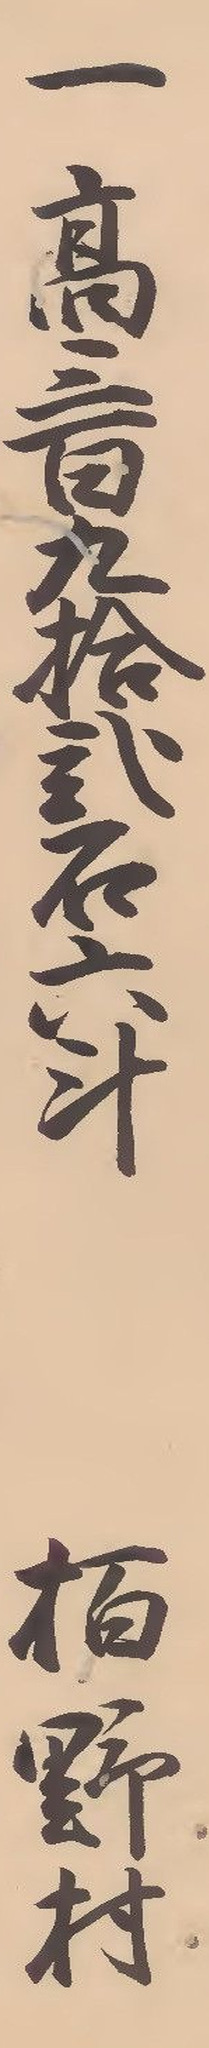一高三百九拾弐石六斗栢野村
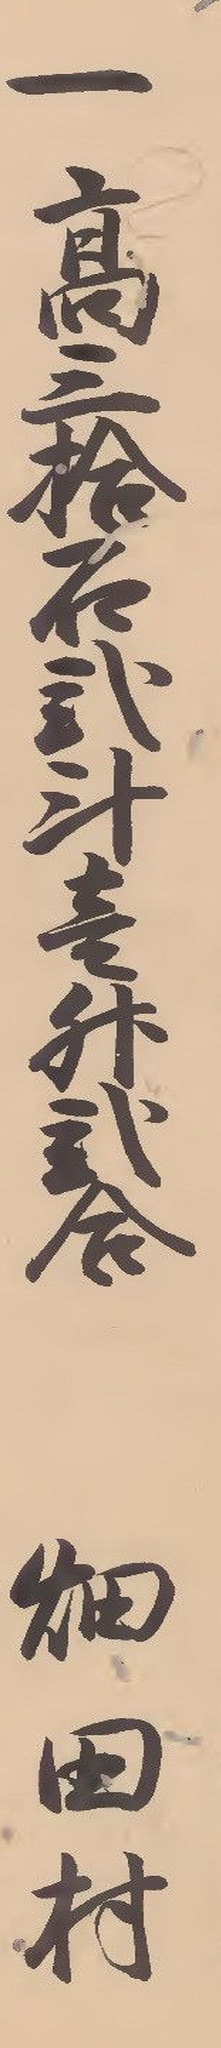一高三拾石弐斗壱升弐合畑田村
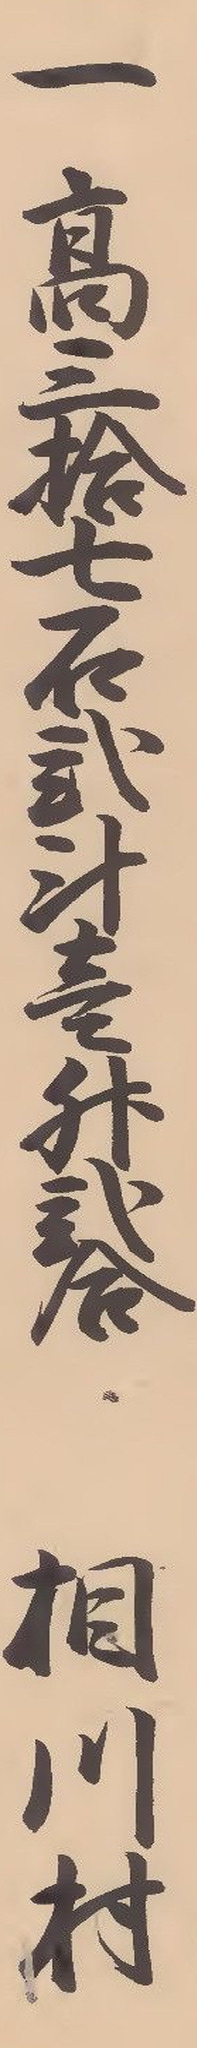一高三拾七石弐斗壱升弐合相川村
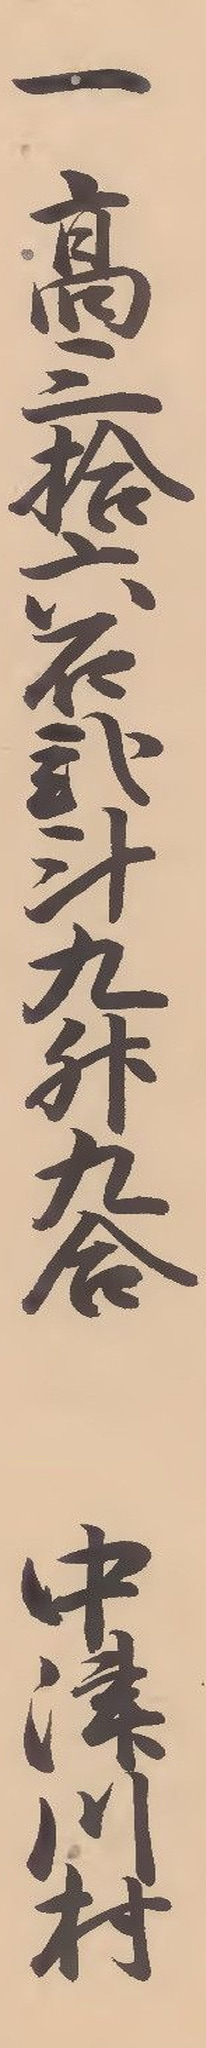一高三拾六石弐斗九升九合中津川村
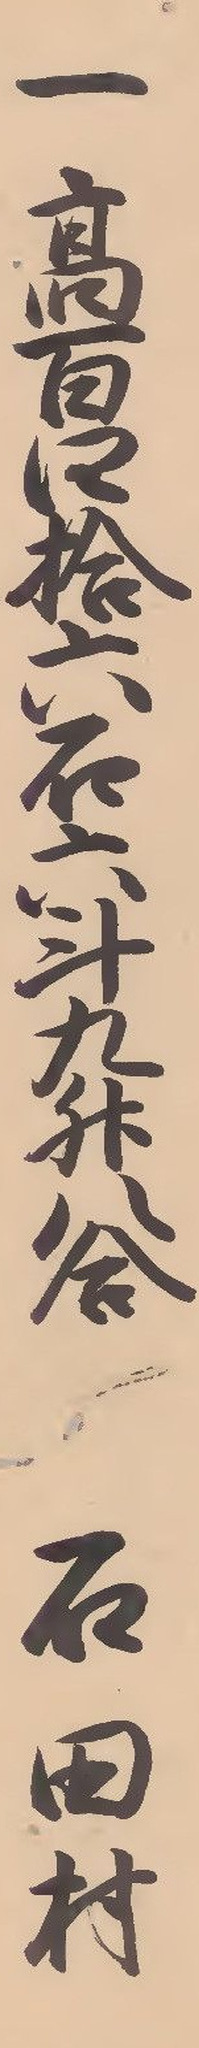一高百四拾六石六斗九升八合石田村

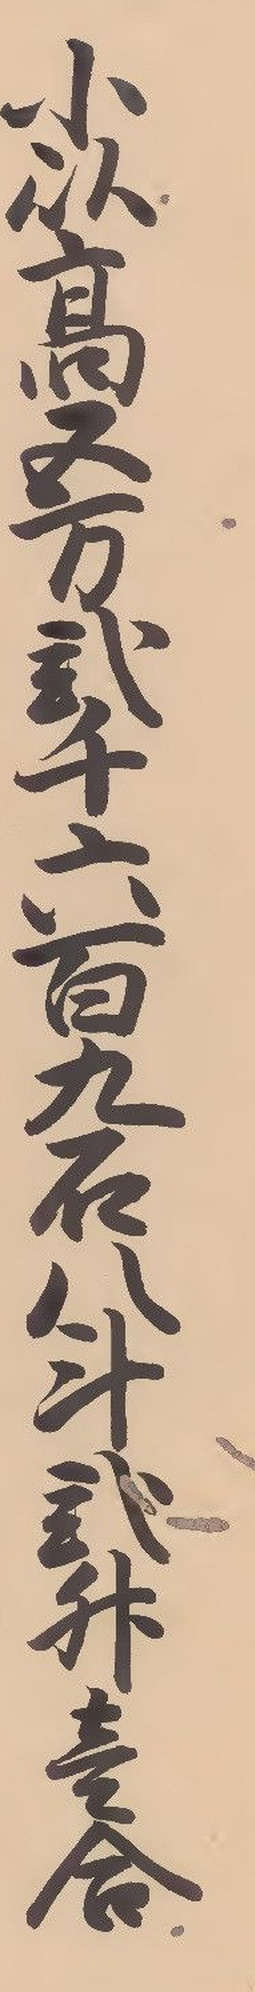小以高五万弐千六百九石八斗弐升壱合
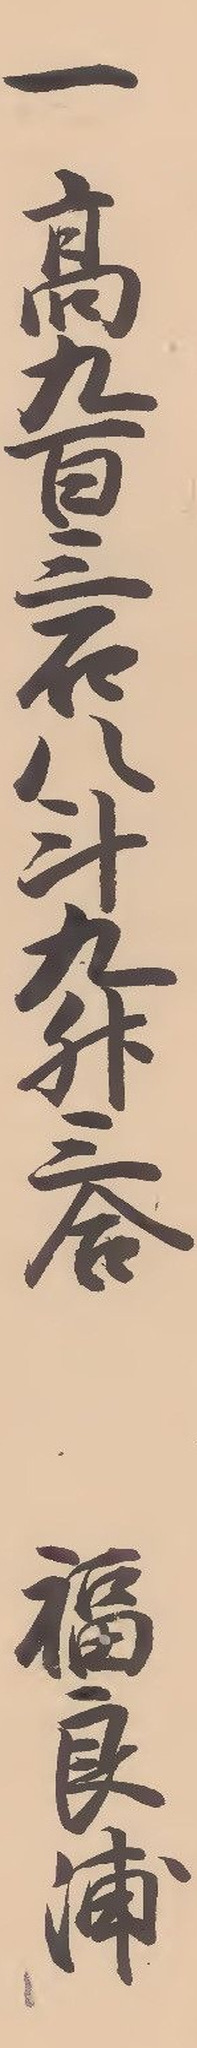一高九百三石八斗九升三合福良浦
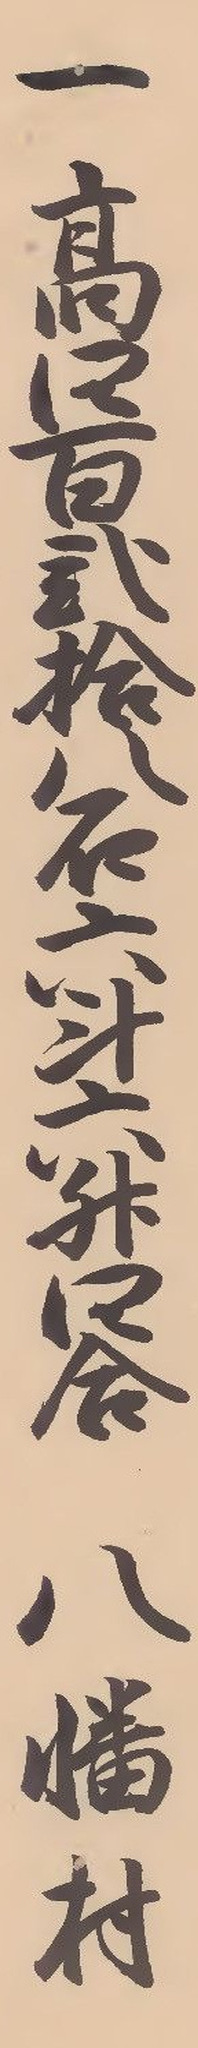一高四百弐拾八石六斗六升四合八幡村
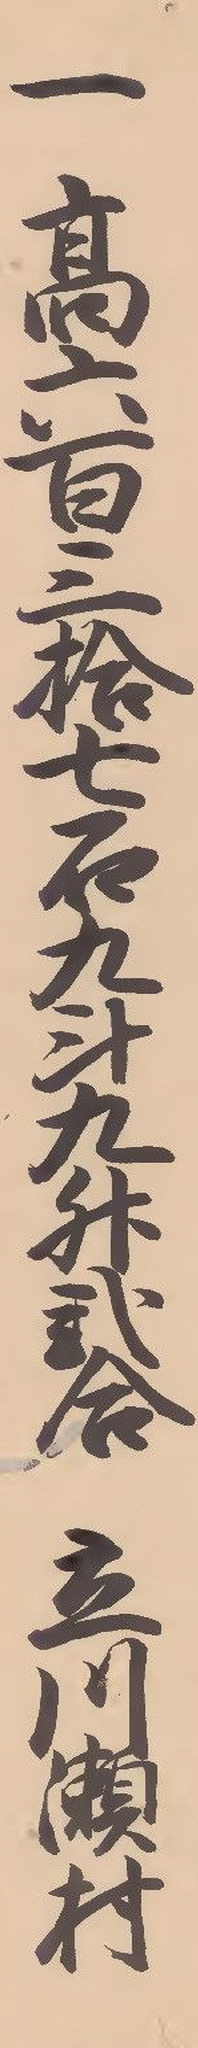一高六百三拾七石九斗九升弐合立川瀬村

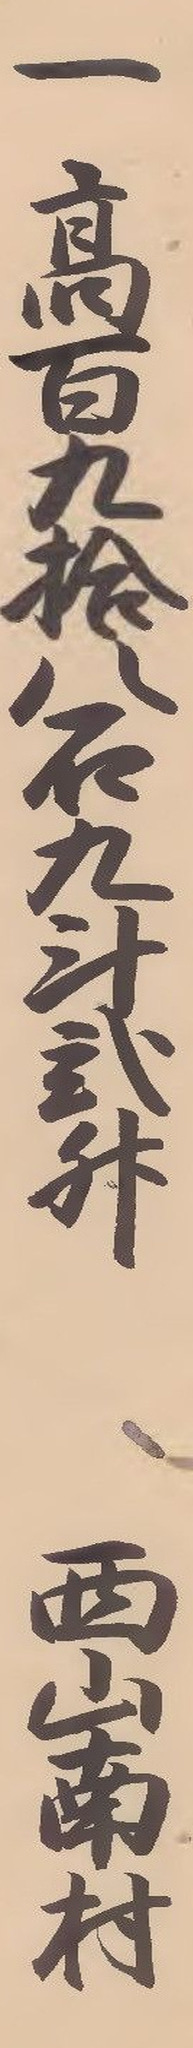一高百九拾八石九斗弐升西山南村
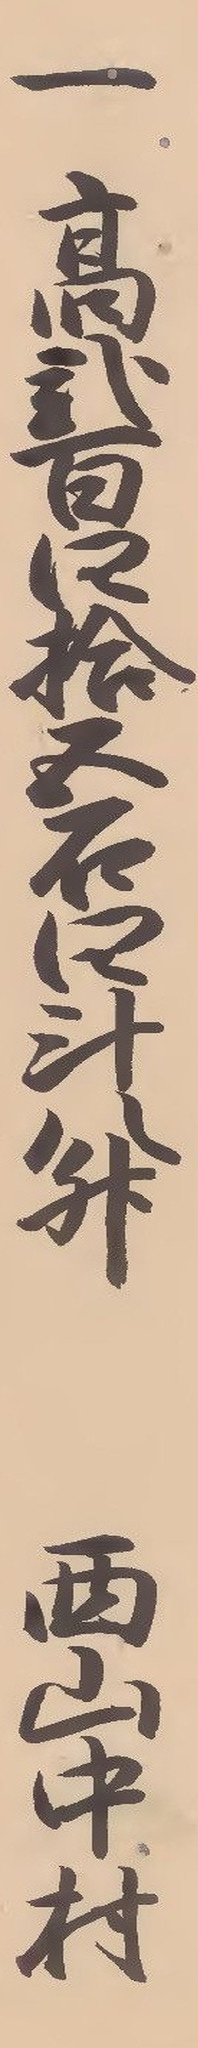一高弐百四拾五石四斗八升西山中村
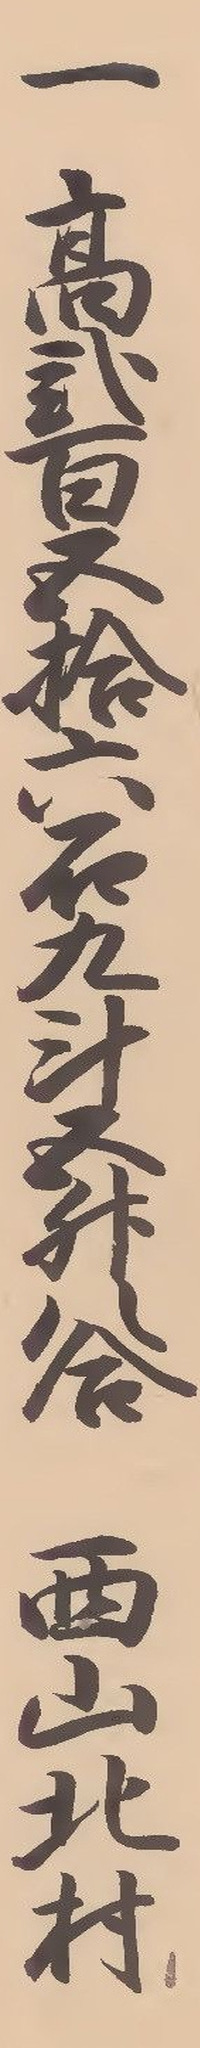一高弐百五拾六石九斗五升八合西山北村
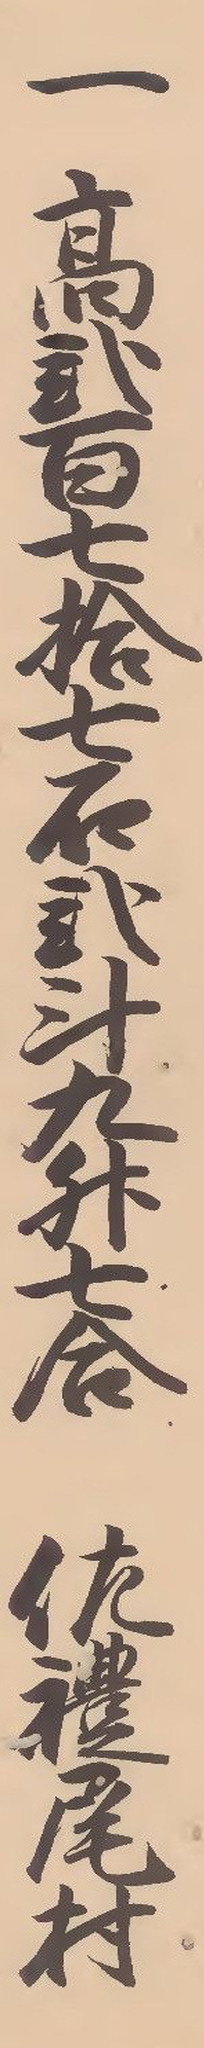一高弐百七拾七石弐斗九升七合佐礼尾村
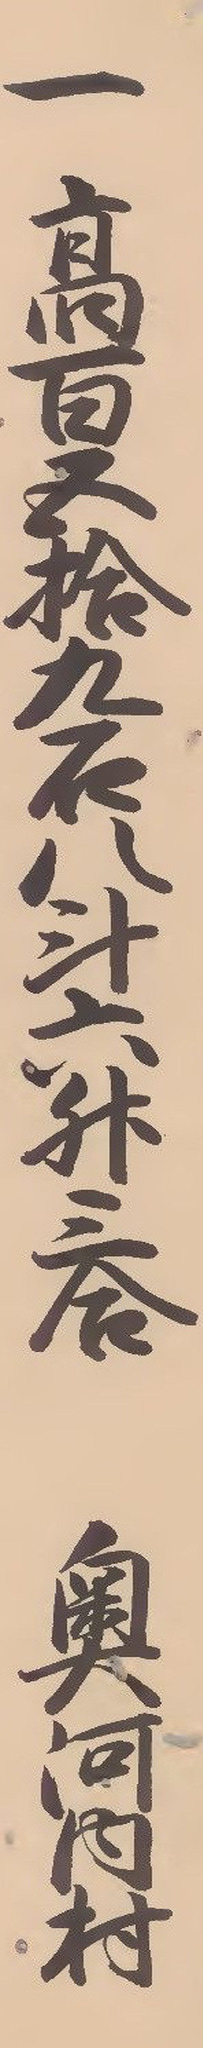一高百五拾九石八斗六升三合奥河内村
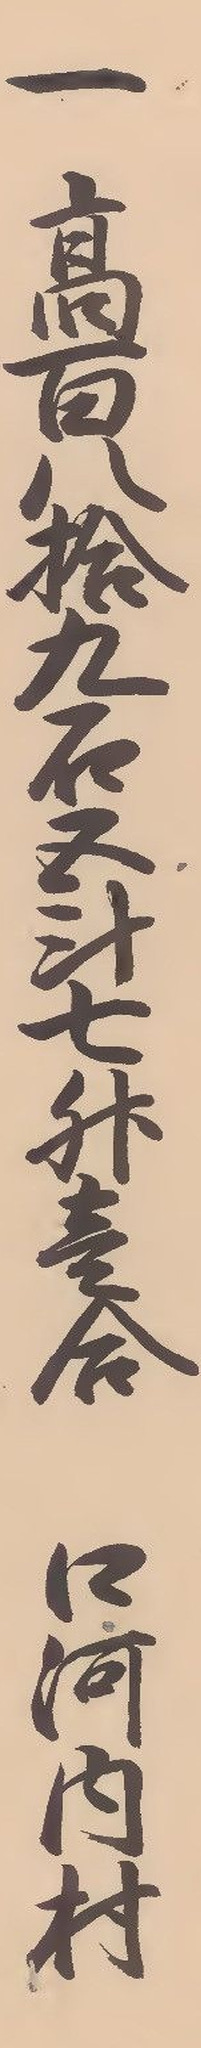一高百八拾九石五斗七升壱合口河内村
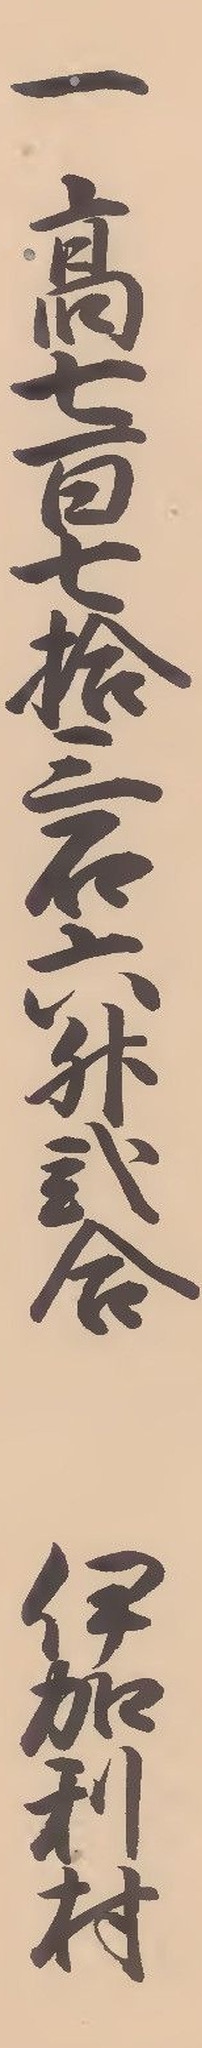一高七百七拾三石六升弐合伊加利村
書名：淡路国郷帳
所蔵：国立公文書館 National Archives of Japan
